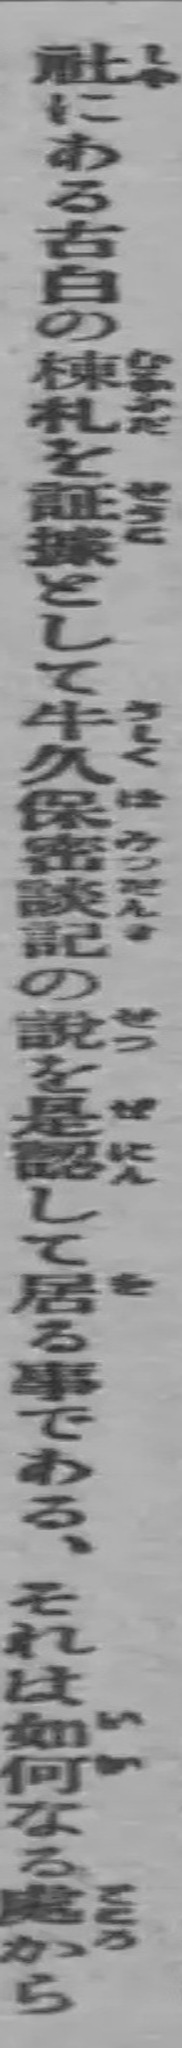社にある古白の棟札を証拠として牛久保密談記の説を是認して居る事である、それは如何なる処から
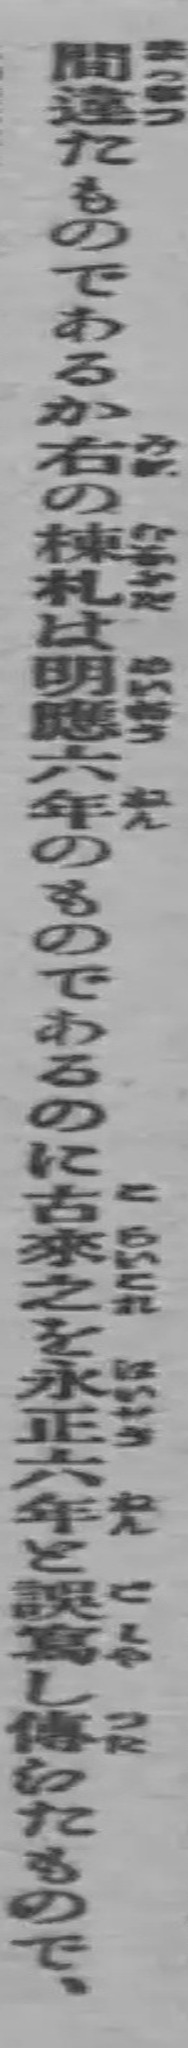間違たものであるか右の棟札は明応六年のものであるのに古来之を永正六年と誤写し伝えたもので、
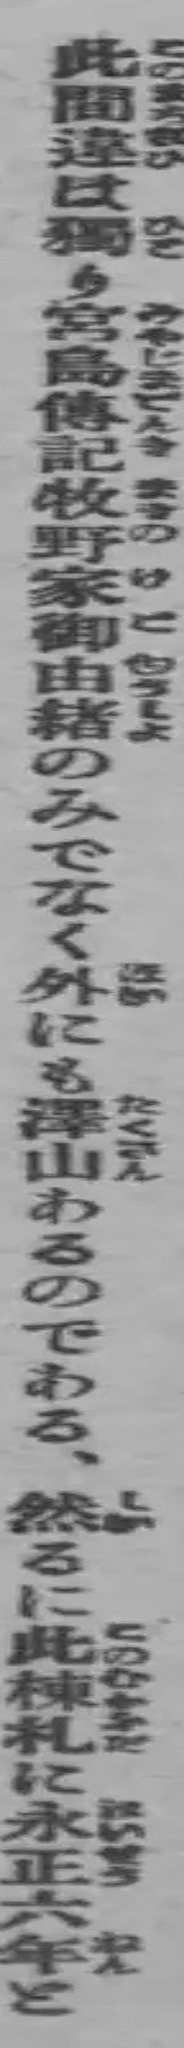此間違は独り宮島伝記牧野家御由緒のみでなくほ外にも沢山あるのである、然るに此棟札に永正六年と
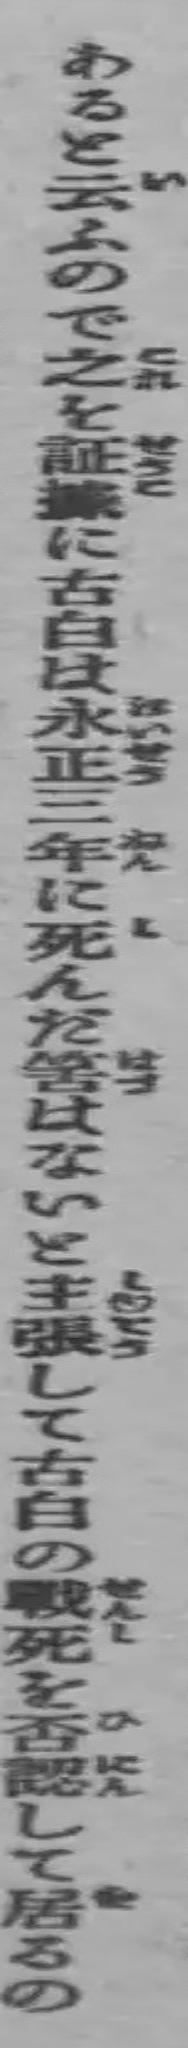あると云ふので之を証拠に古白は永正三年に死んだ筈はないと主張して古白の戦死を否認して居るの
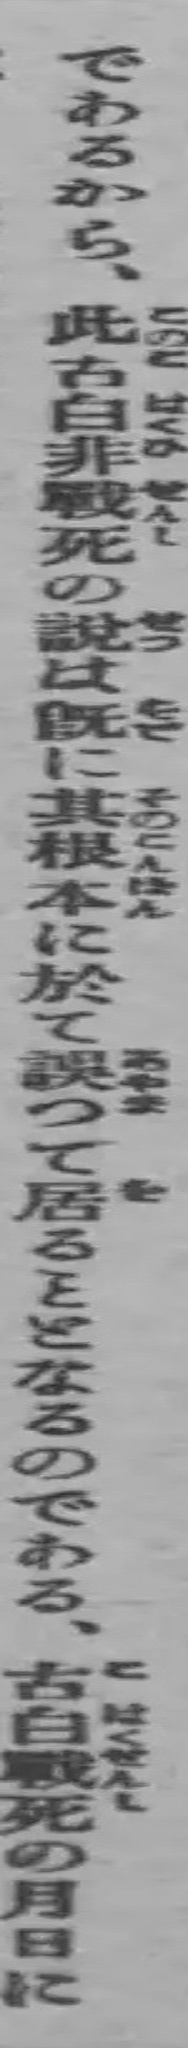であるから、此古白非戦死の説は既に其根本に於て誤つて居ることとなるのである、古白戦死の月日に
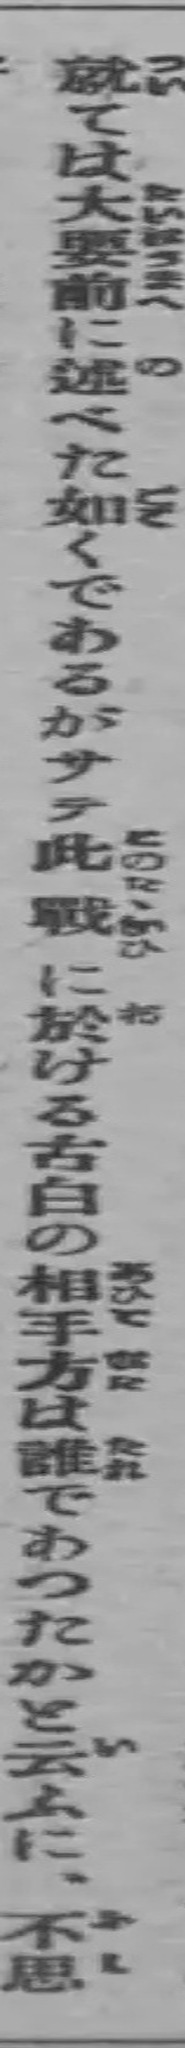就ては大要前に述べた如くであるがサテ此戦に於ける古白の相手方は誰であつたかと云ふに、不思
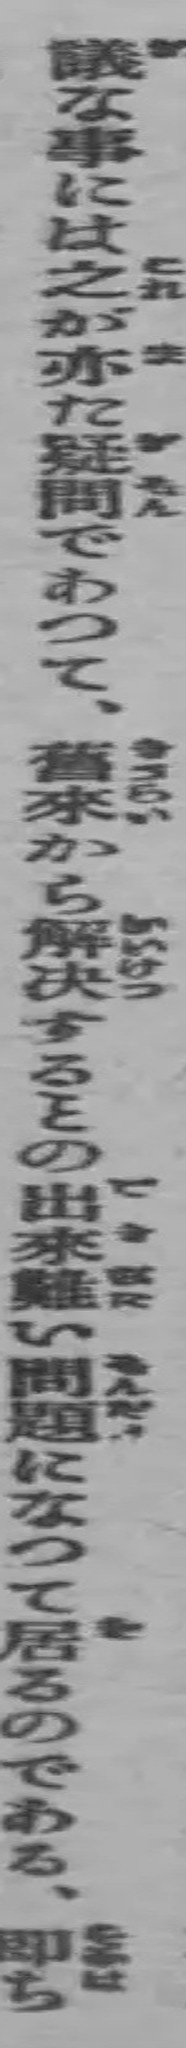議な事には之が亦た疑問であつて、旧来から解決することの出来難い問題になつて居るのである、即ち
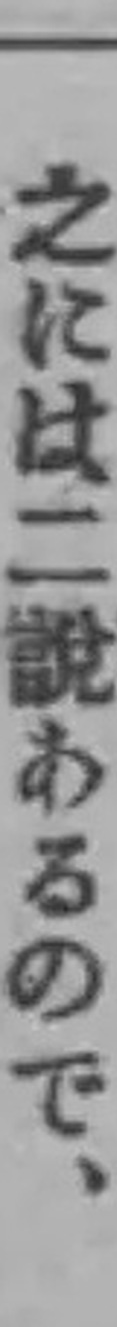之には二説あるので、
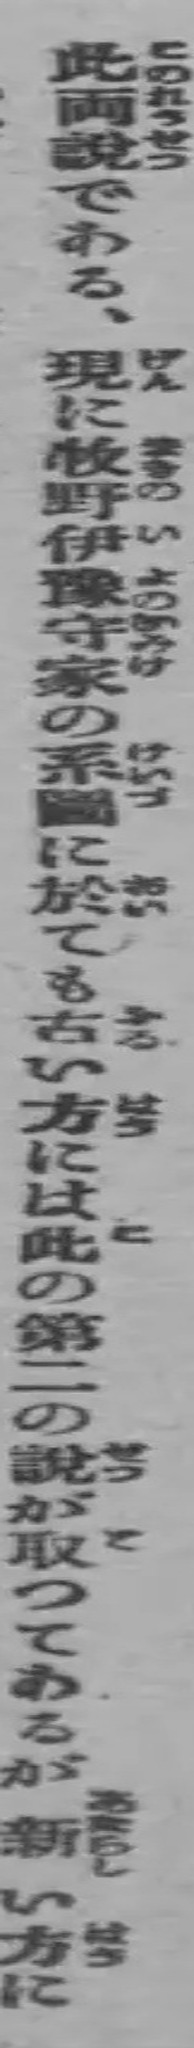此両説である、現に牧野伊予守家の系図に於ても古い方には此の第二の説が取つてあるが新い方に
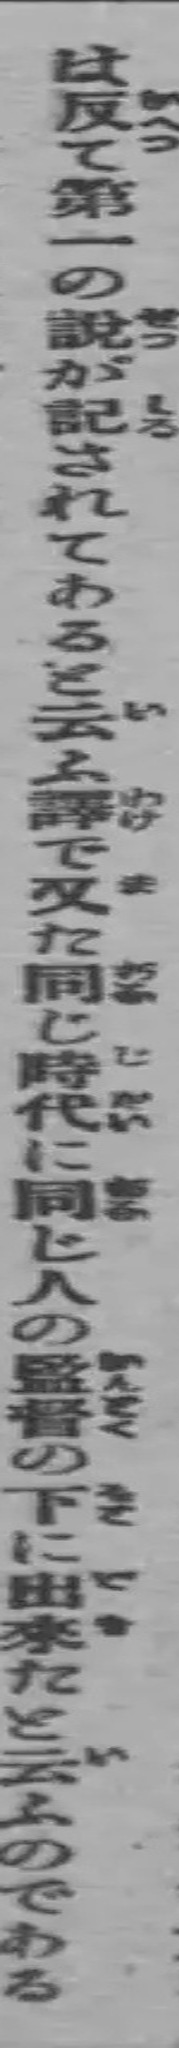は反て第一の説が記されてあると云ふ訳で又た同じ時代に同じ人の監督の下に出来たと云ふのである
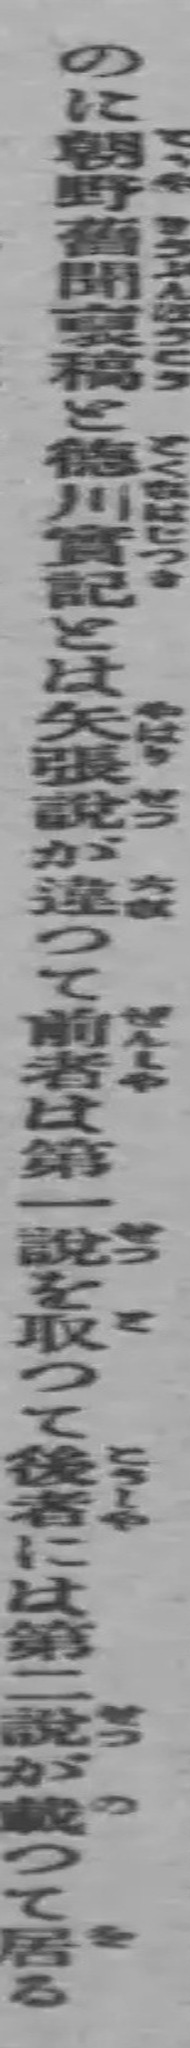のに朝野旧聞襃稿と徳川実記とは矢張説が違つて前者は第一説を取つて後者には第二説が載つて居る
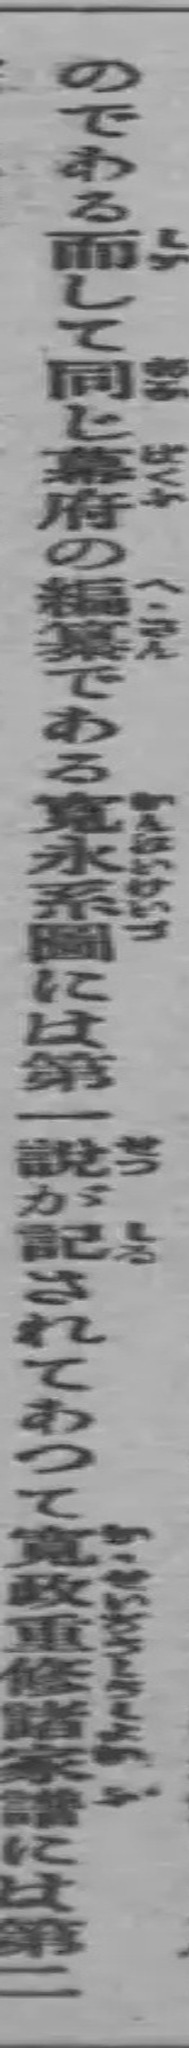のである而して同じ幕府の編纂である寛永系図には第一説が記されてあつて寛政重修諸家譜には第二
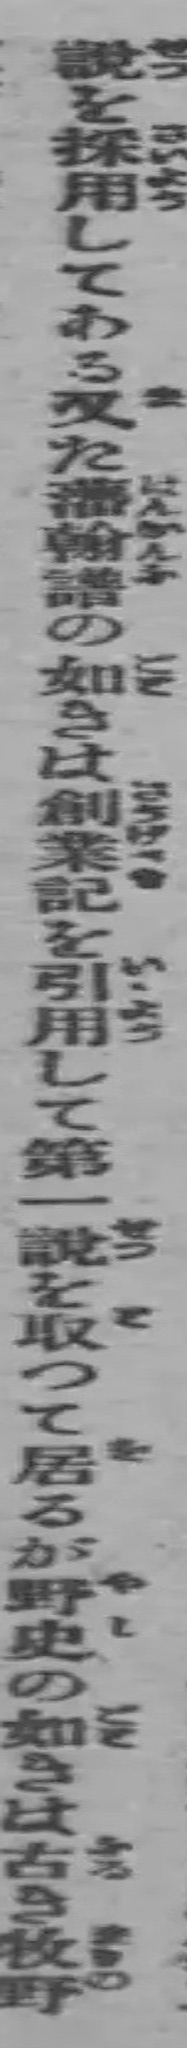説を採用してある又た藩翰譜の如きは創業記を引用して第一説を取つて居るが野史の如きは古き牧野
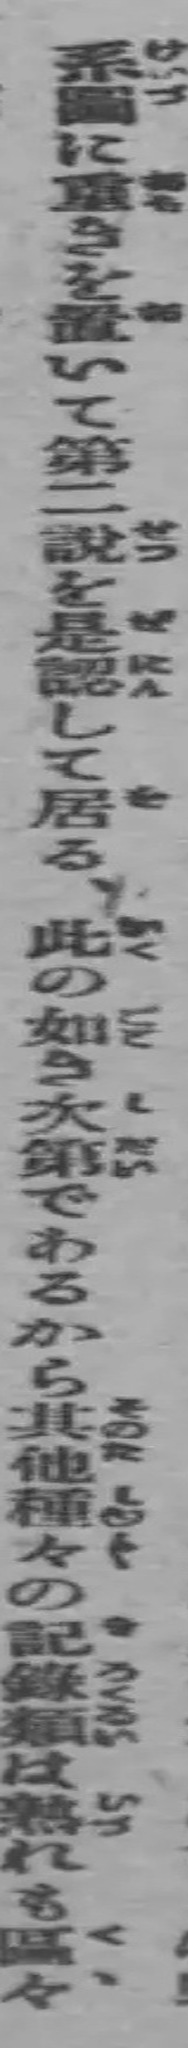系図に重きを置いて第二説を是認して居る、此の如き次第であるから其他種々の記録類は熟れも区々
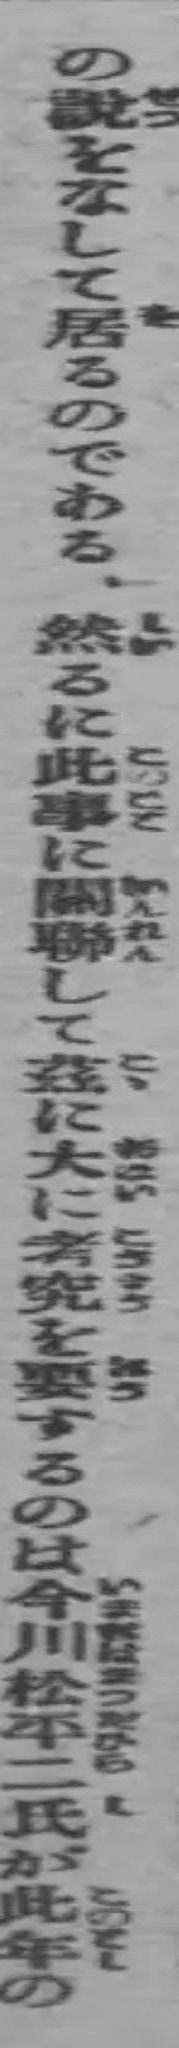の説をなして居るのである、然るに此事に関連して茲に大に考究を要するのは今川松平二氏が此年の
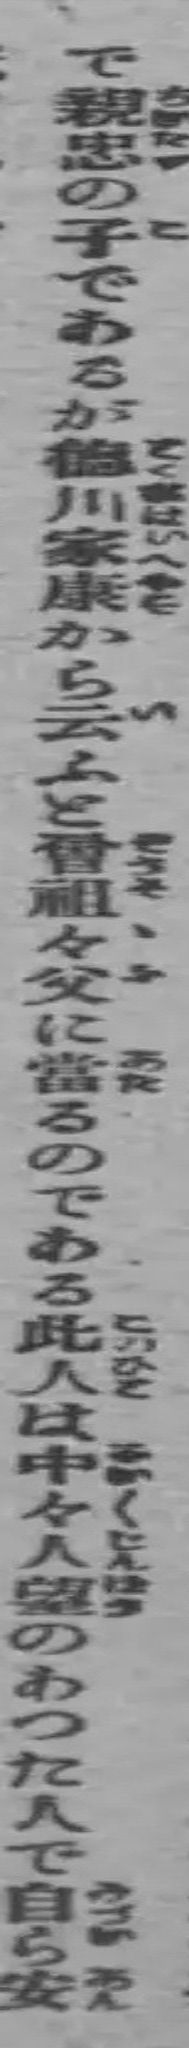戦で親忠の子であるが徳川家康から云ふと曽祖々父に当るのである此人は中々人望のあつた人で自ら安
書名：豊橋市史談
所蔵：国立国会図書館 National Diet Library, JAPAN
